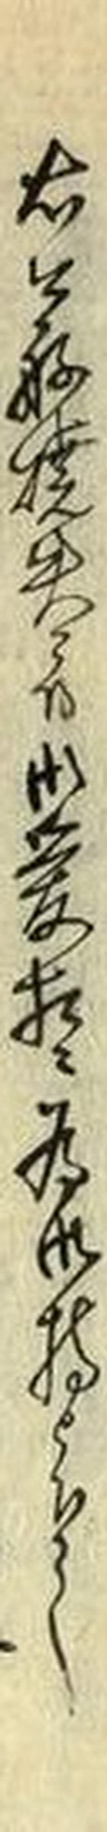右今般焼失ニ付御愛相ニ為御持被下之
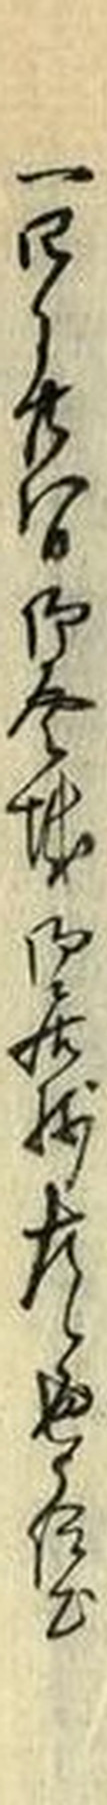一四月廿八日御登城御居残左之通被仰出
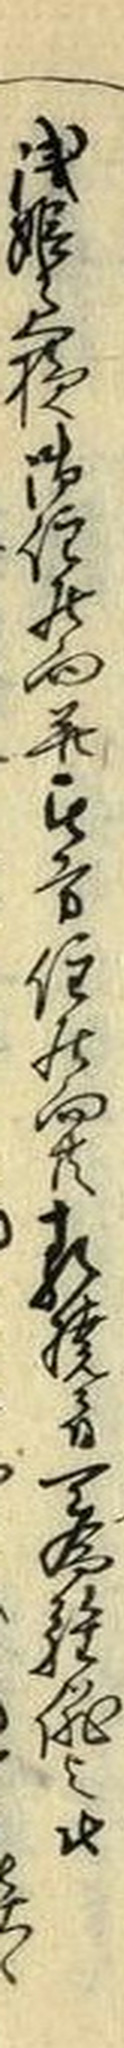浅姫君様御住居向并其方住居向共類焼ニ付可為難儀と被
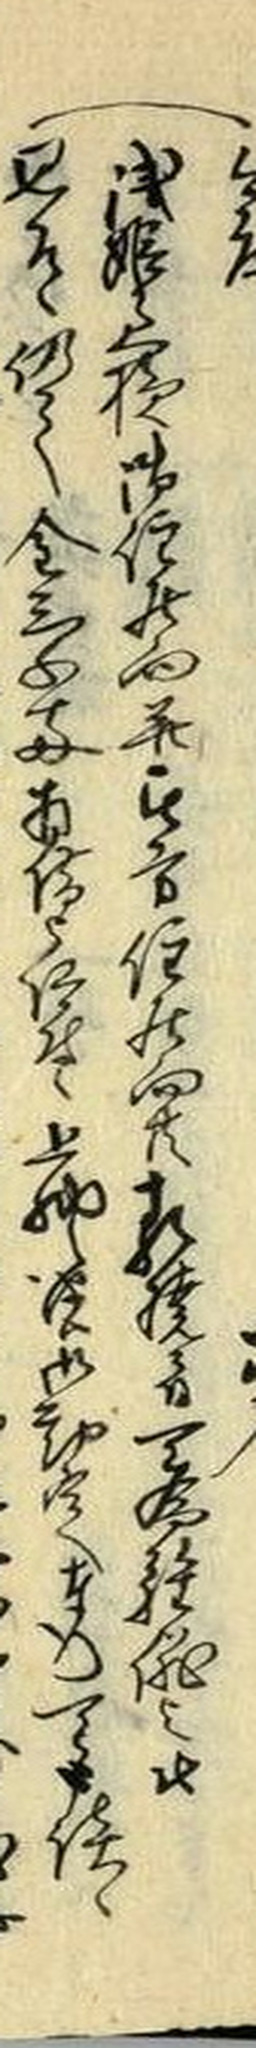思召候仍之金三千両拝借被仰付候上納之儀ハ御勘定奉行可申談候
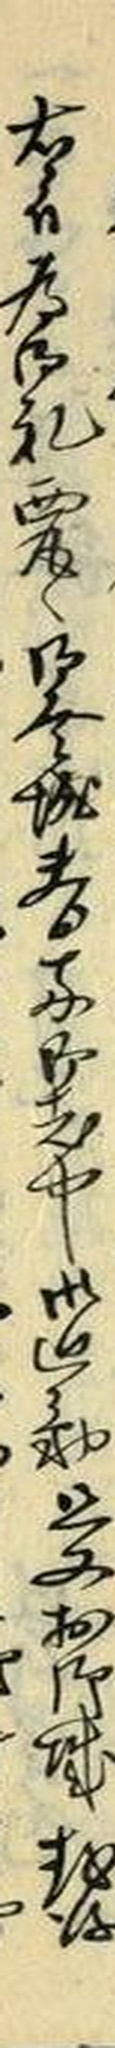右ニ付為御礼西丸へ御登城夫ゟ両御老中御廻勤且又於御城越後
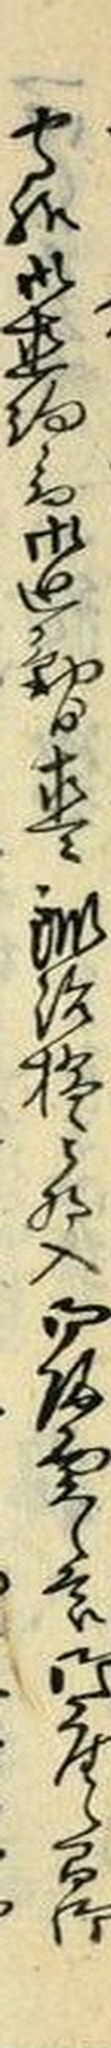守様御直泊ニ而御廻勤ゟ直々鍛冶橋へ被為入御帰殿之節御座之間御
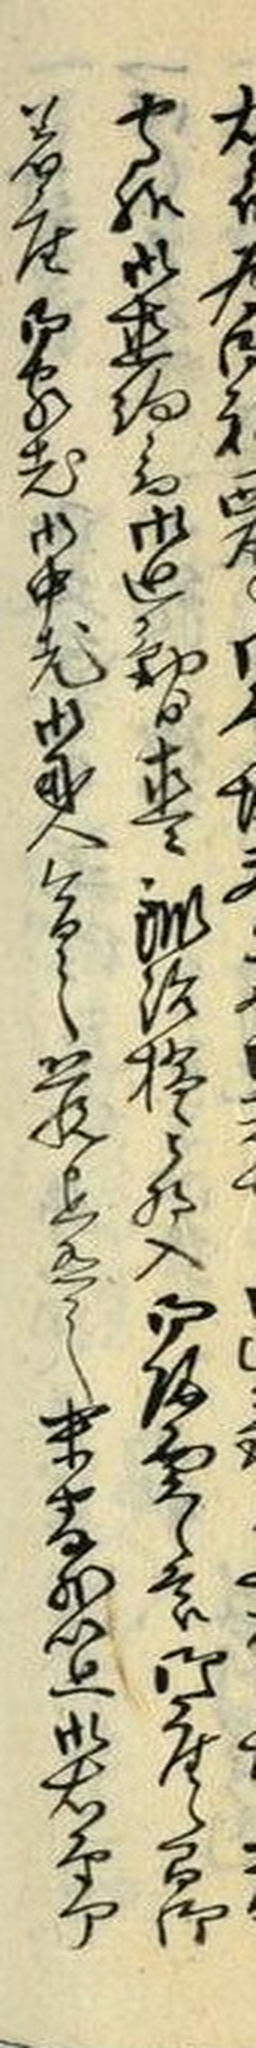着座御家老御中老御用人今日之恐悦申上有之未番外以上御右筆部
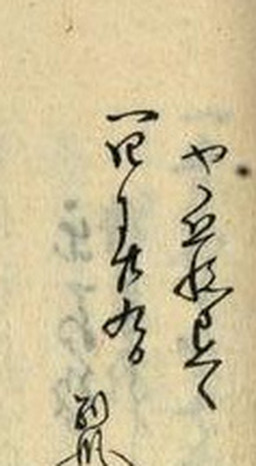一四月廿九日
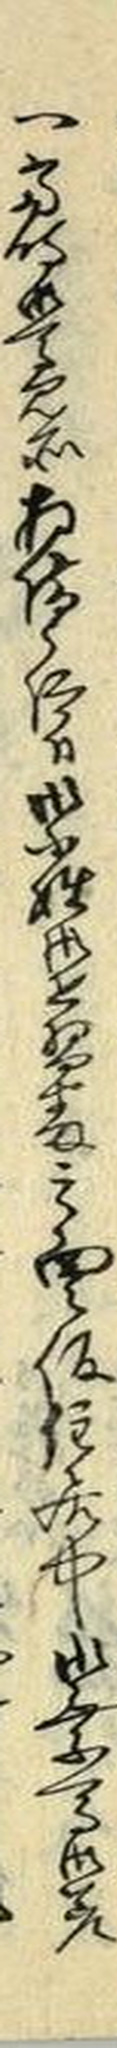一当時御馬見所拝借被仰付候付御小姓御近習番之面々仮住居中御乗馬御差
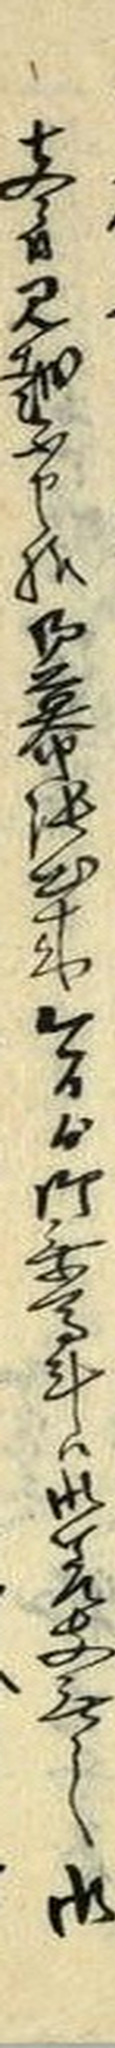支ニ付見越不申候様御幕張出来今日ゟ御乗馬斗ハ御差支無之御
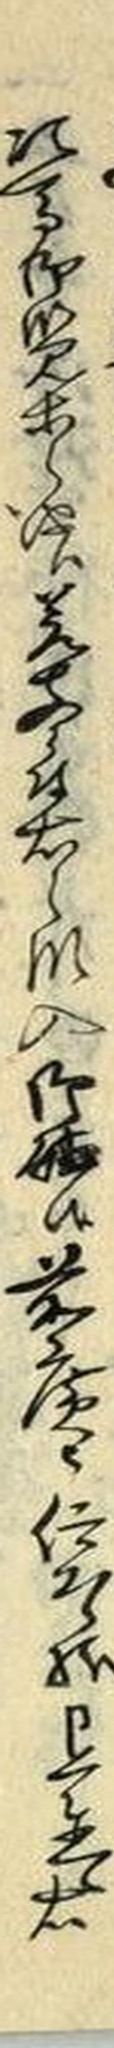次馬御覧等之儀ハ差支ニ付右之段入御聴候前広被仰出候様申上置候右
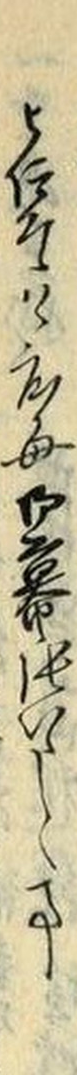被仰出候ハゝ度毎御幕張いたし候事
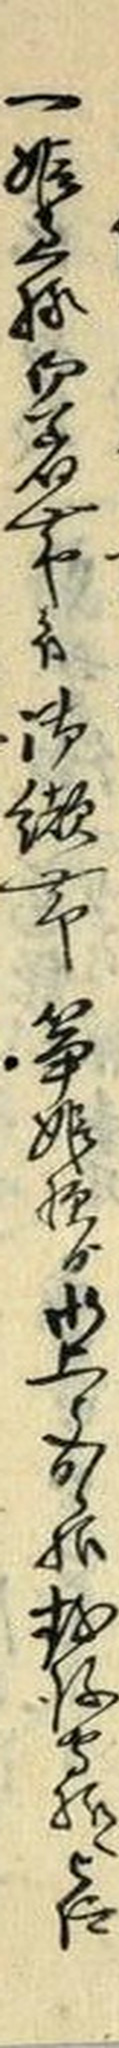一姫君様御着帯ニ付御纈帯箏姫様ゟ御上被成候様越後守様へ被仰
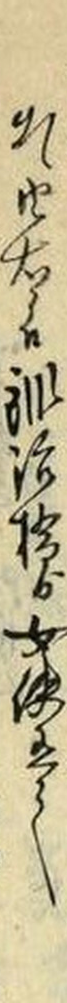出候由右ニ付鍛冶橋ゟ女使有之
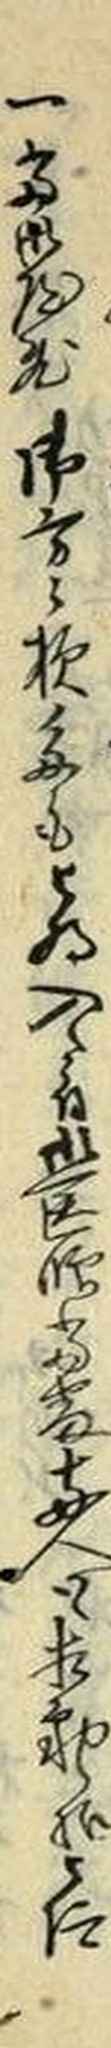一当御屋敷御方々様多々も被為入候ニ付御医師当番両人ツゝ相勤候様被仰
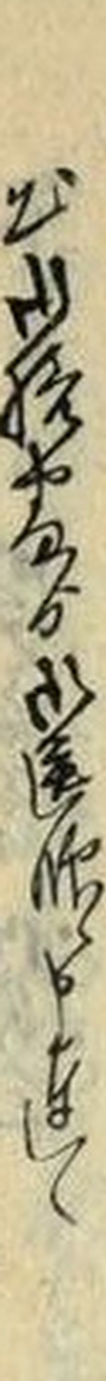出御膳番ゟ御医師へ申達候
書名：少傅日録抄（斉承付側向頭取日記、在府）
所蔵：福井県文書館 Fukui Prefectural Archives
